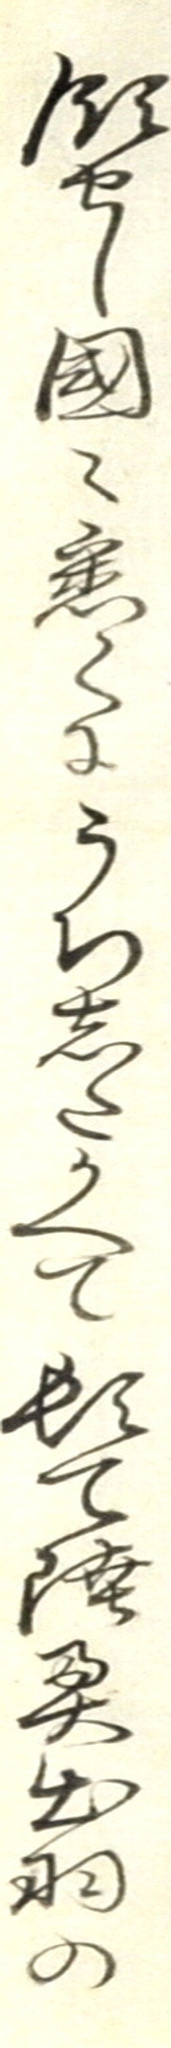領せし国々悉くにうちしたかへて頓て陸奥出羽の

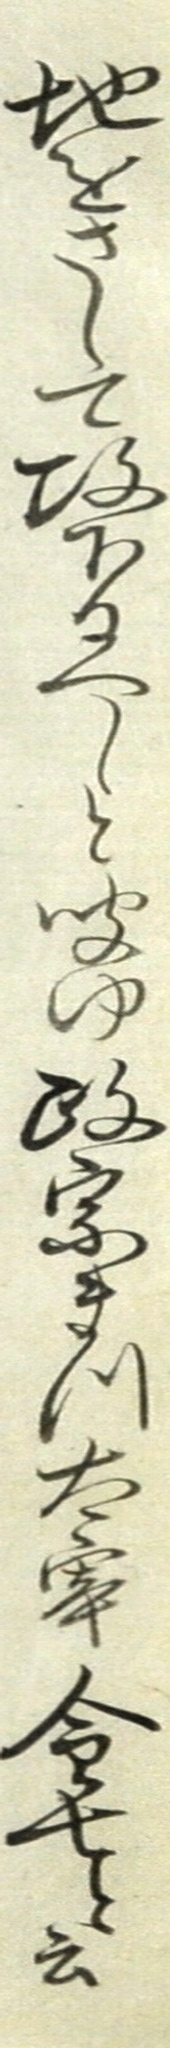地をさして攻下るへしと聞ゆ政宗まつ太宰金七と云
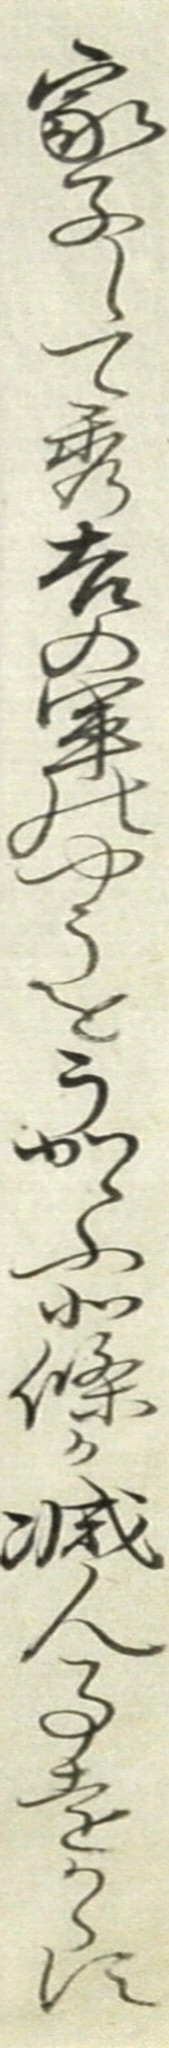家子して秀吉の軍のやうをうかゝふ北条か滅ん事遠からす
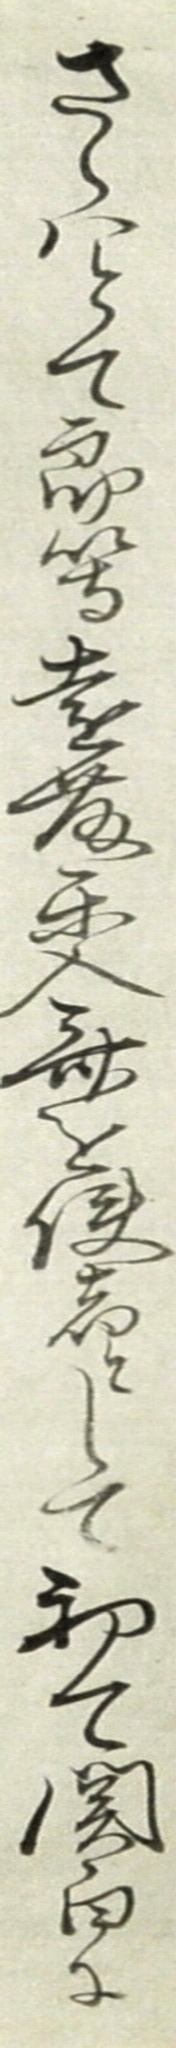さらはとて郎等遠藤楽入斎を使者として初て関白に
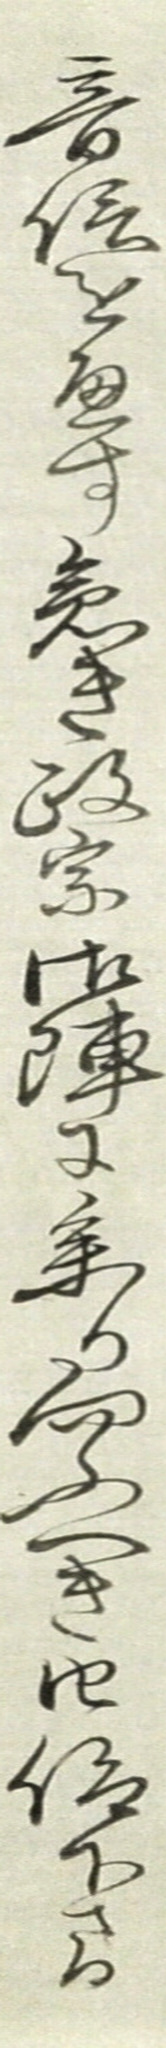音信を通す急き政宗御陣に参り向ふへき由仰下さる
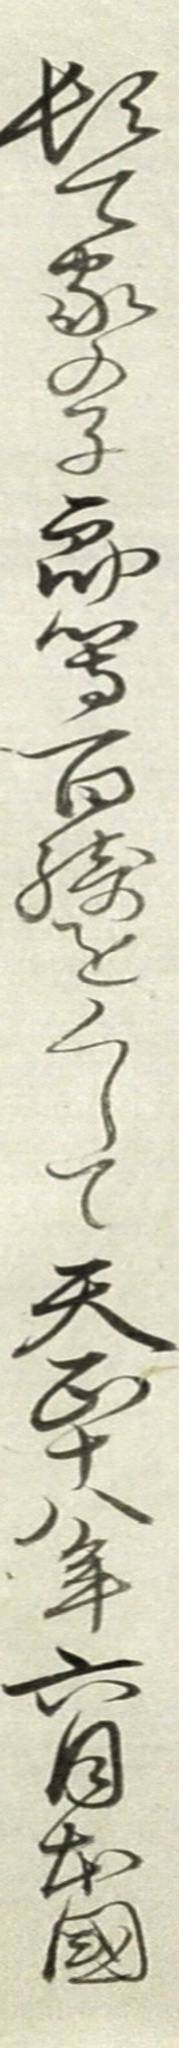頓て家の子郎等百騎をくして天正十八年六月本国
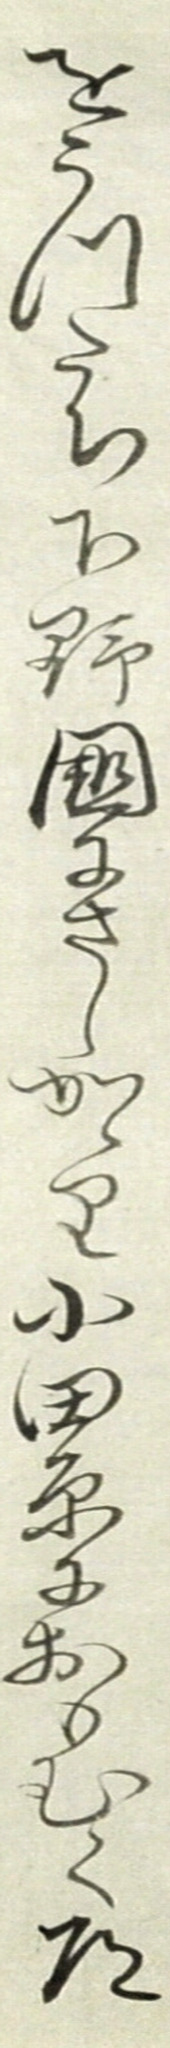をうつたち下野国にさしかゝり小田原におもむく道
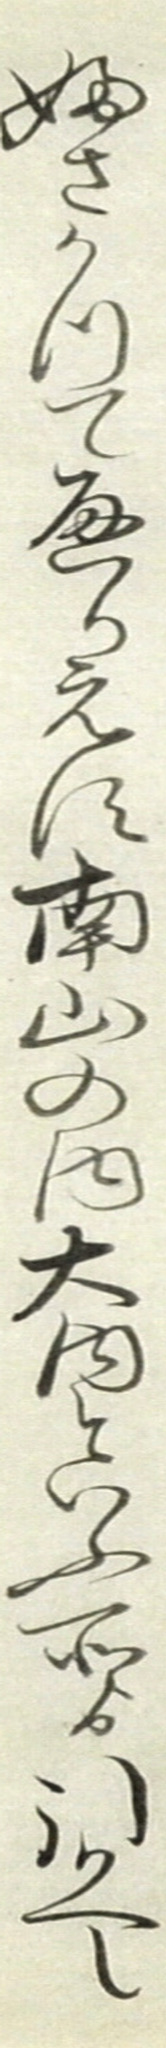ふさかつて通りえす南山の内大内といふ所より引かへし
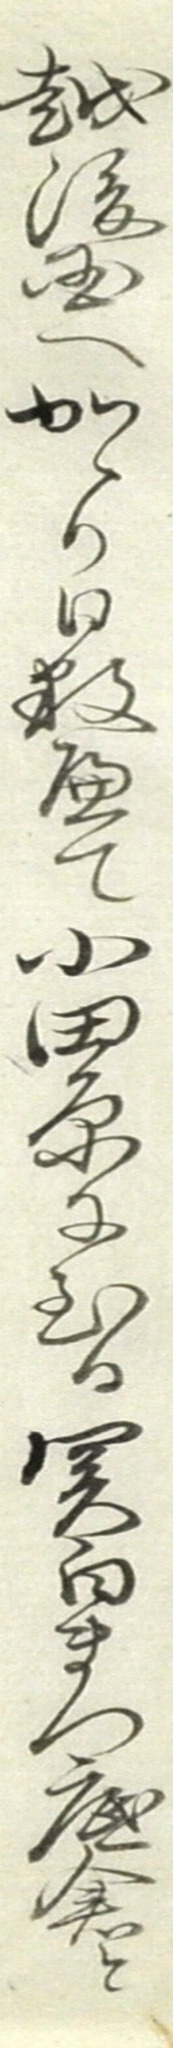越後国へかゝり日数へて小田原に至る関白まつ底倉と
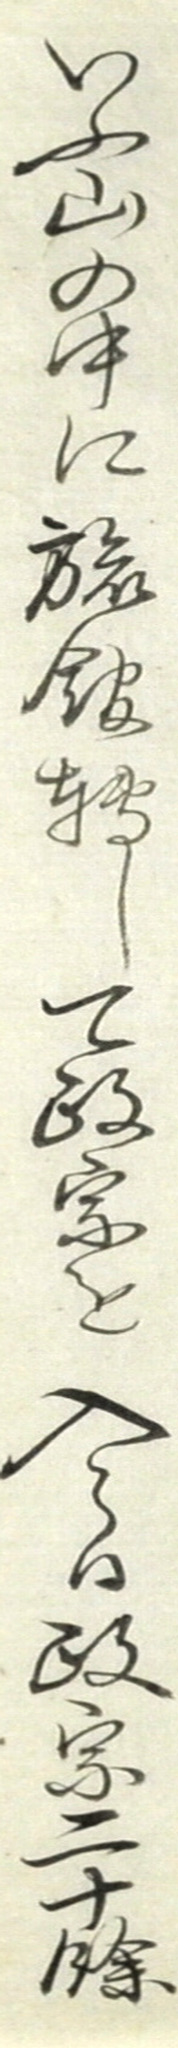いふ山の中に旅館転して政宗を入らる政宗二十余
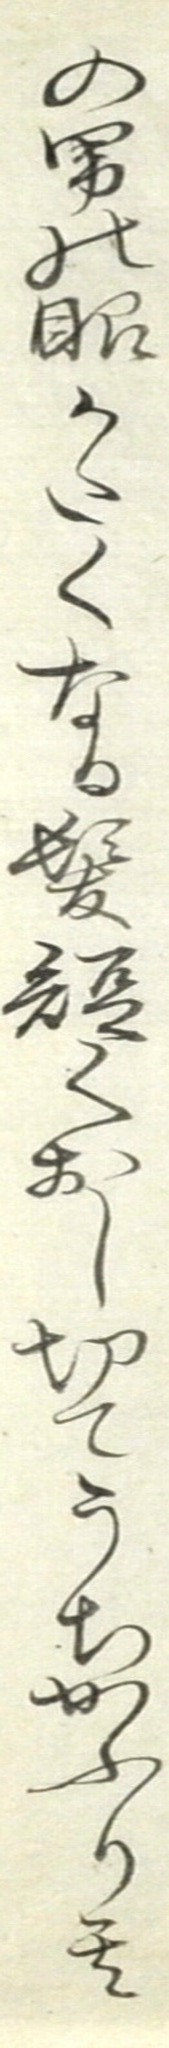の男の眼かたくなる髪短くおし切てうちかふり其
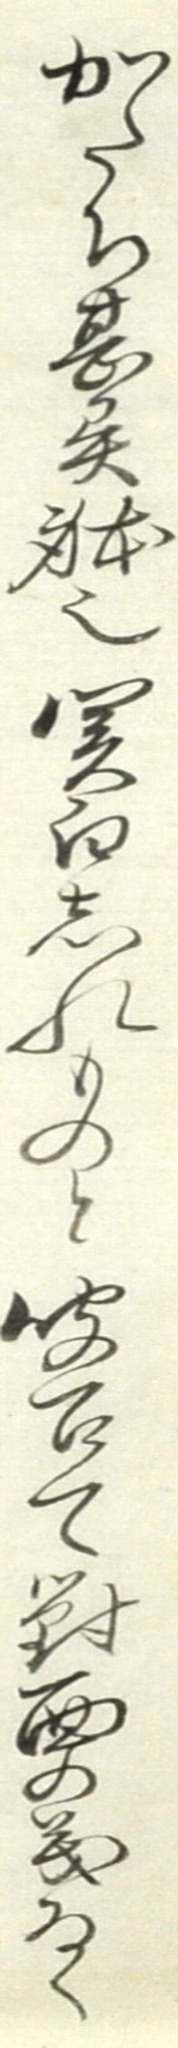かたち甚異体也関白しれものと聞召て対面の義なく
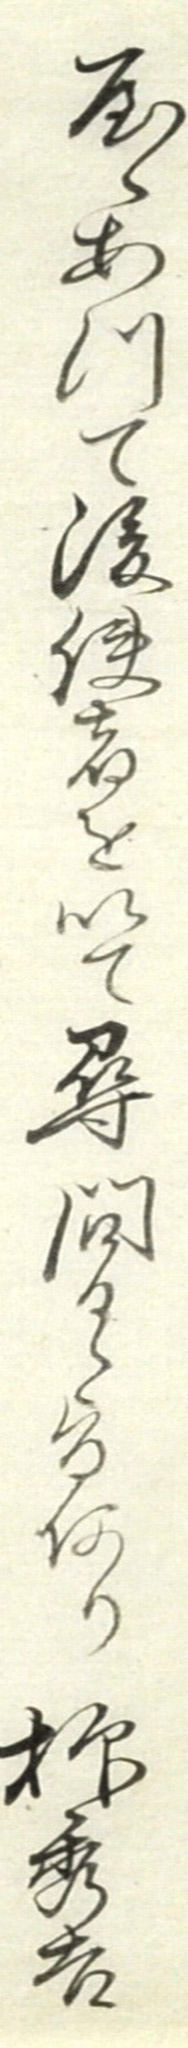やゝあつて後使者を以て尋問るゝ旨あり抑秀吉
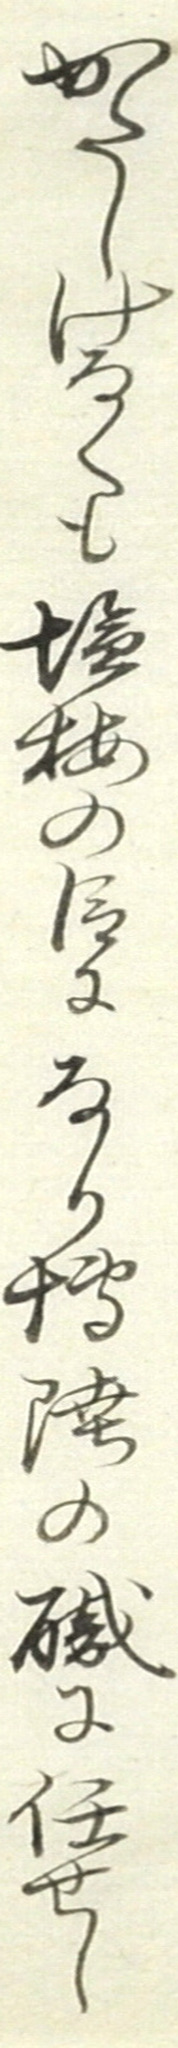かたしけなくも塩梅の臣になり博陸の職に任せし
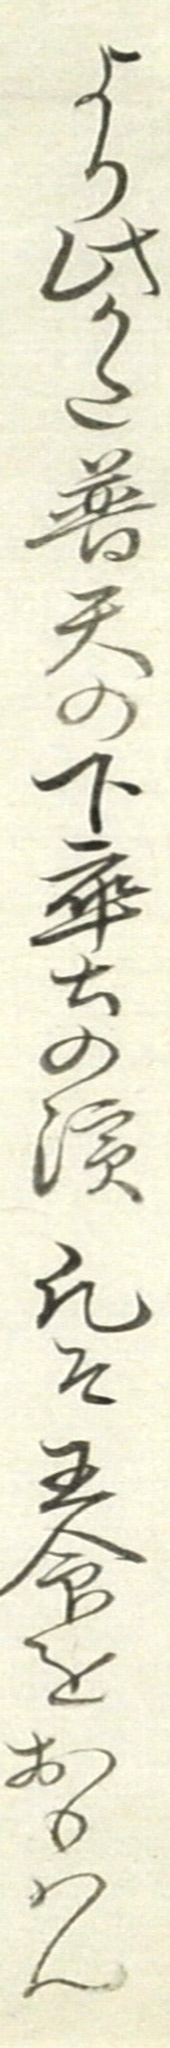より此かた普天の下率土の浜凡そ王命をおもはん
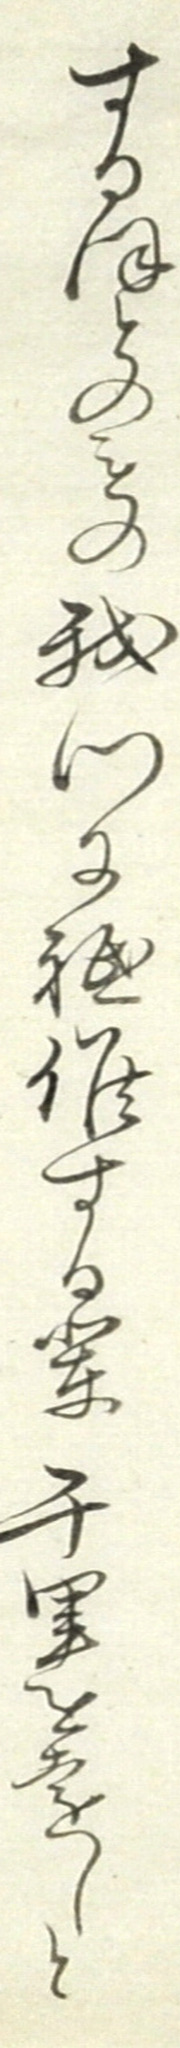するほとのもの我門に祗候する輩千里を遠しと
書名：藩翰譜（七・下）
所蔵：伊那市立高遠町図書館・合同会社AMANE
